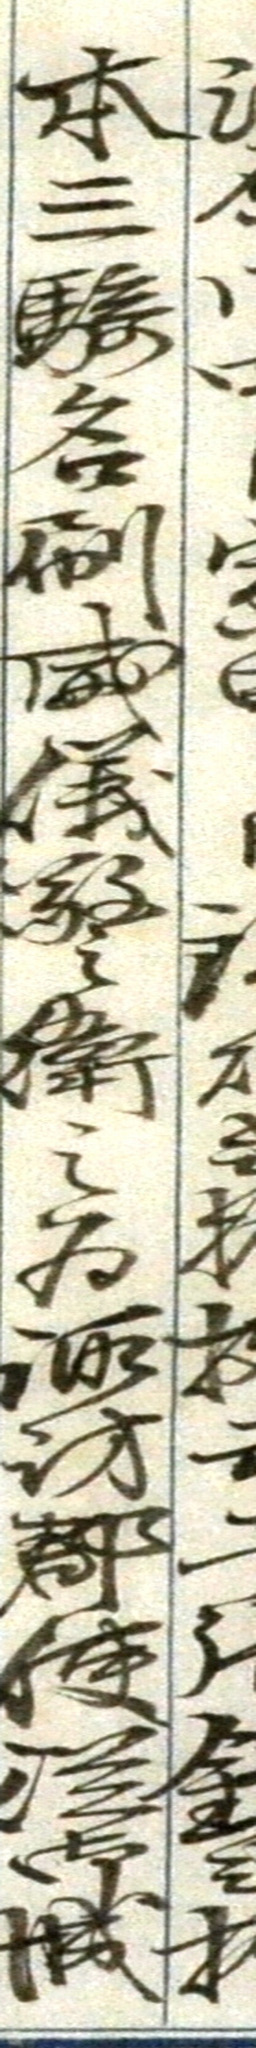本三騎各刷威儀警衛之為諏訪郡使従御城
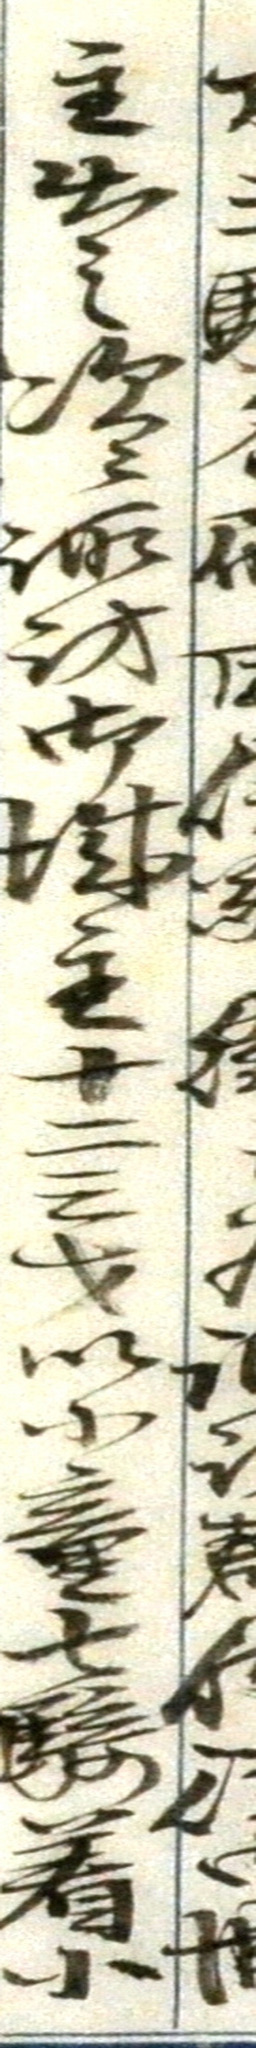主出之次ニ諏訪御城主十二三才以小童七騎着小
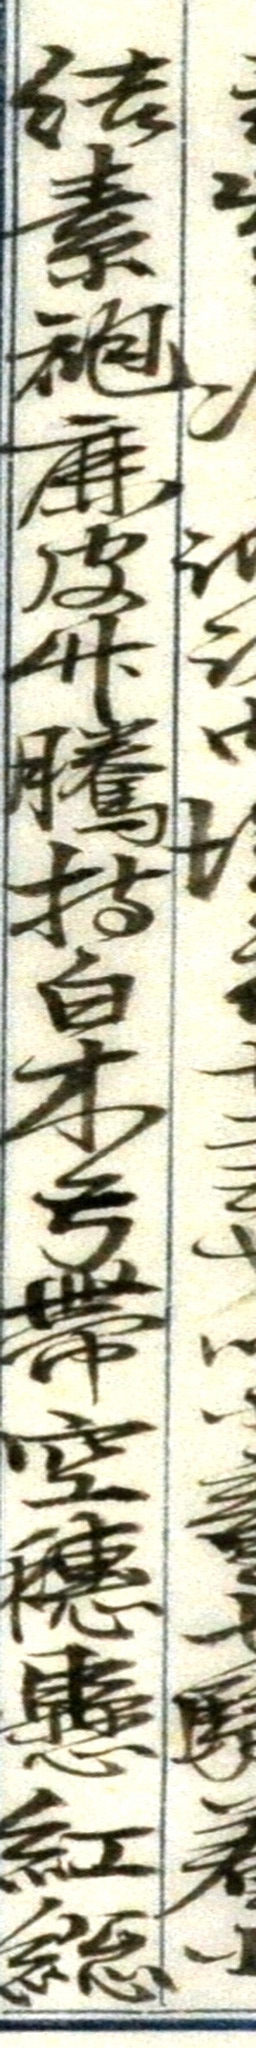結素袍鹿皮竹騰持白木弓帯空穂懸紅総
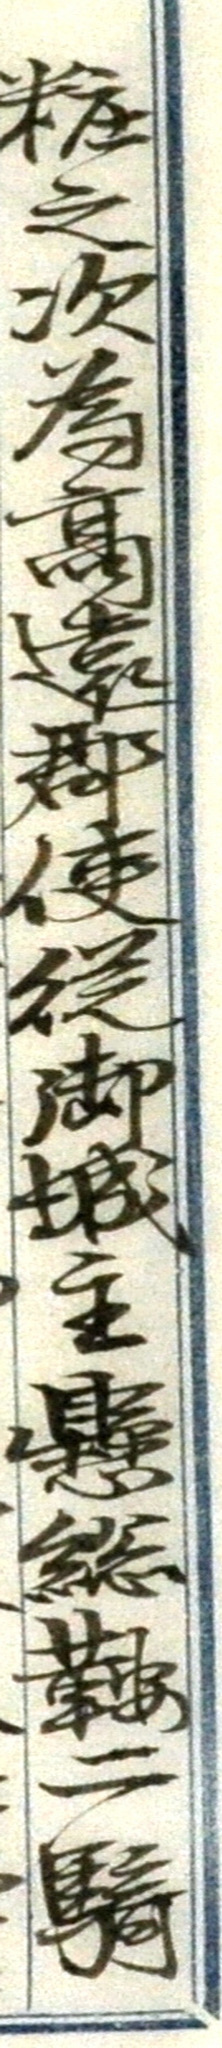粧之次為高遠郡使従御城主懸総鞍二騎
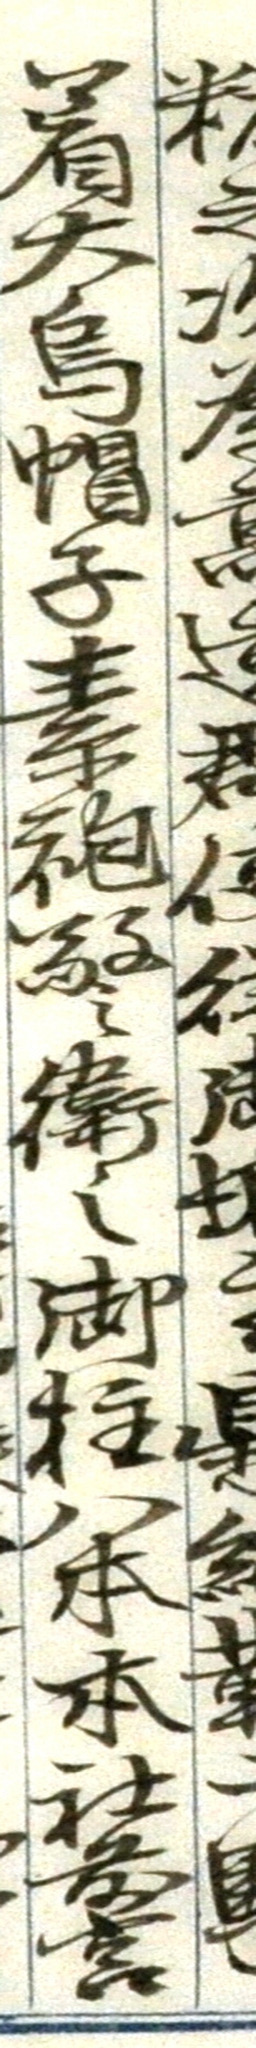着大烏帽子素袍警衛之御柱八本本社前宮
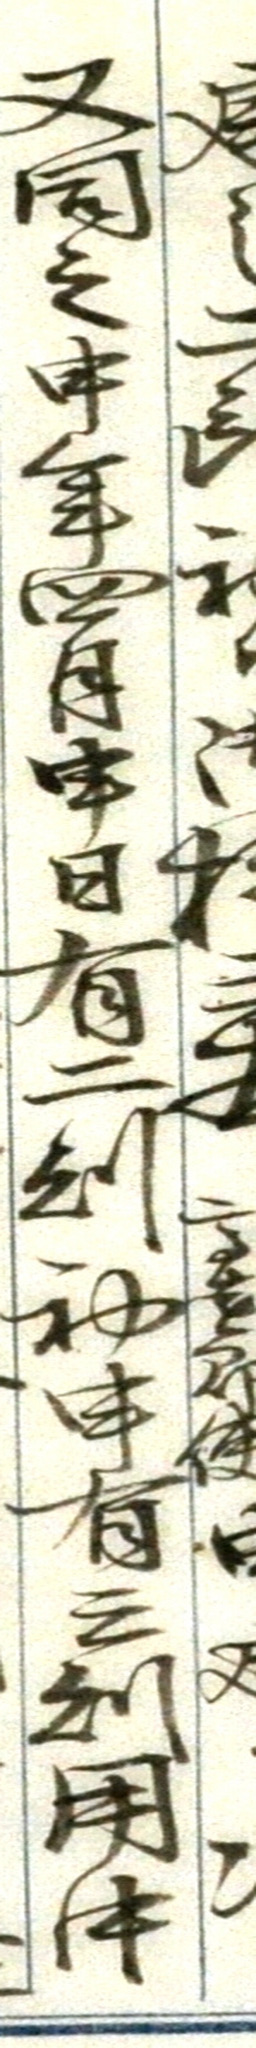又同之申年四月申日有二則初申有三則用中
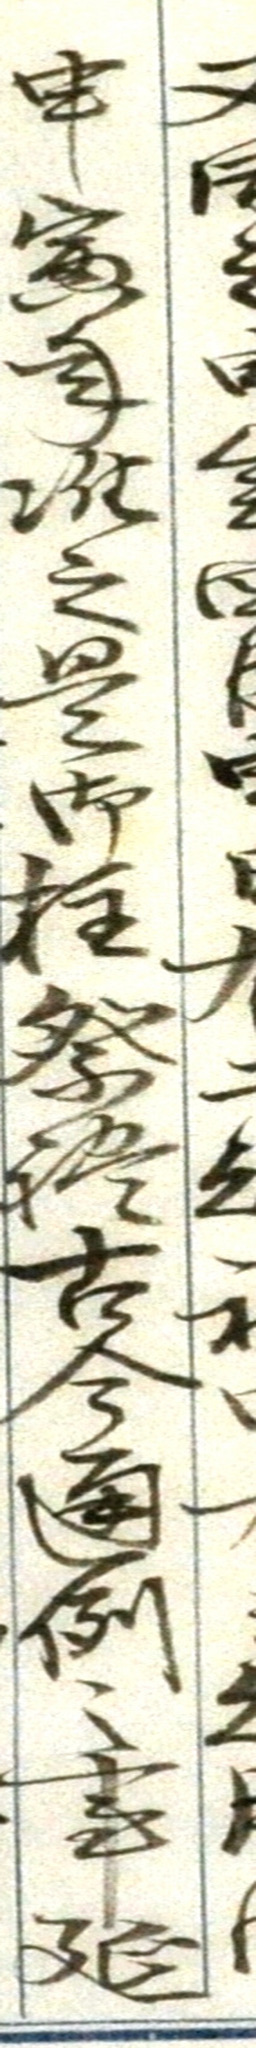申寅年准之是御柱祭礼古今通例之事延
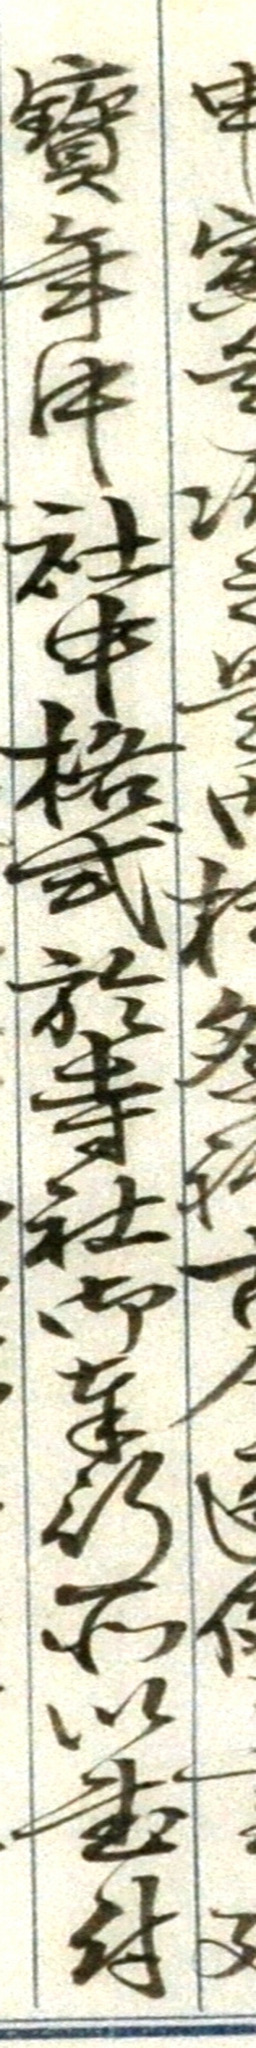宝年中社中格式於寺社御奉行所以書付
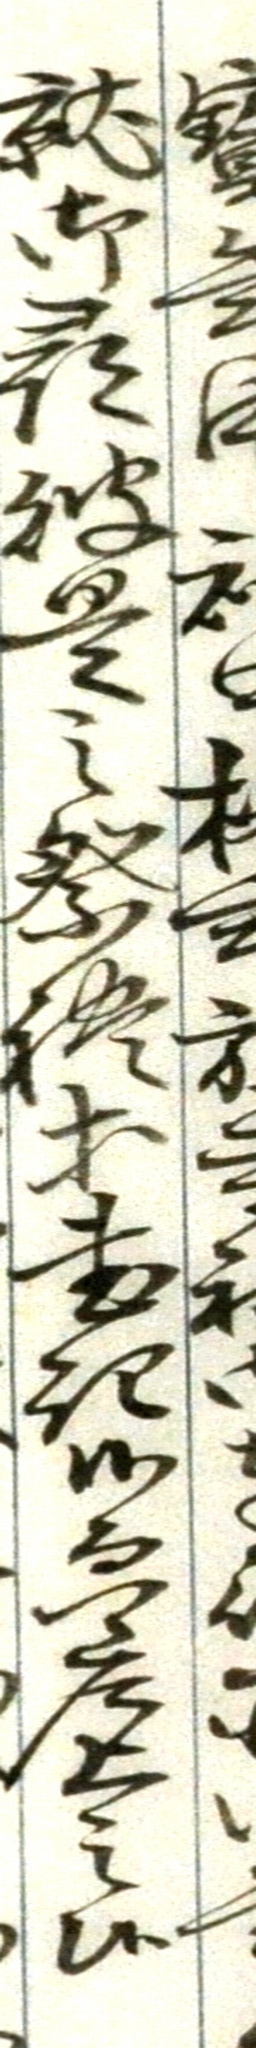就御尋彼是之祭礼等書記候而差上之候
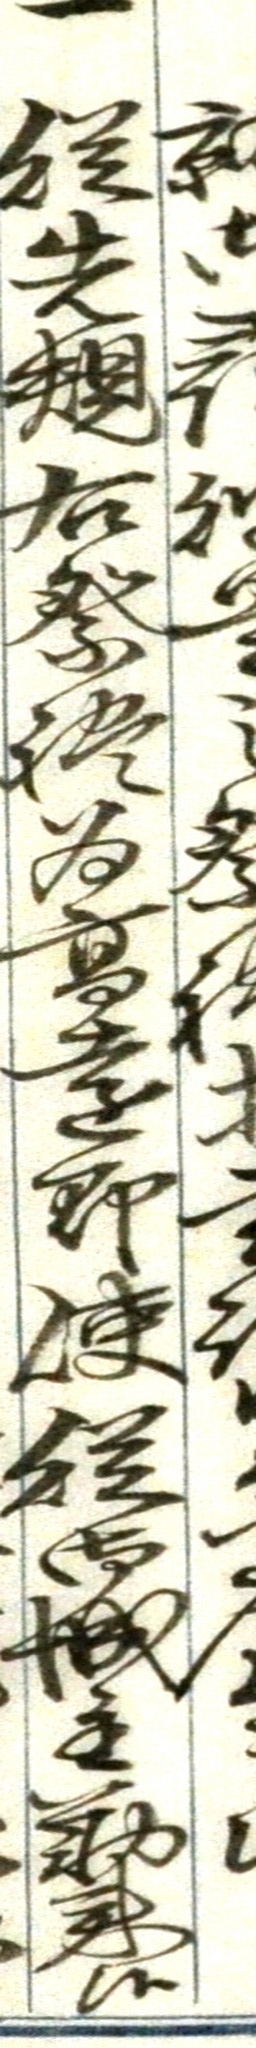一従先規右祭礼為高遠郷使従御城主勤来候
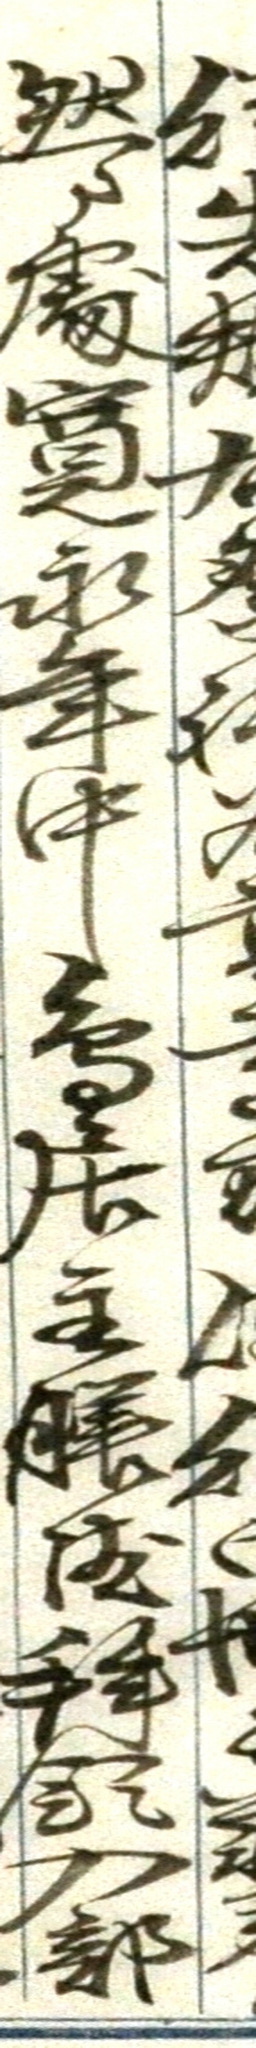然る処寛永年中鳥居主膳殿拝領入部
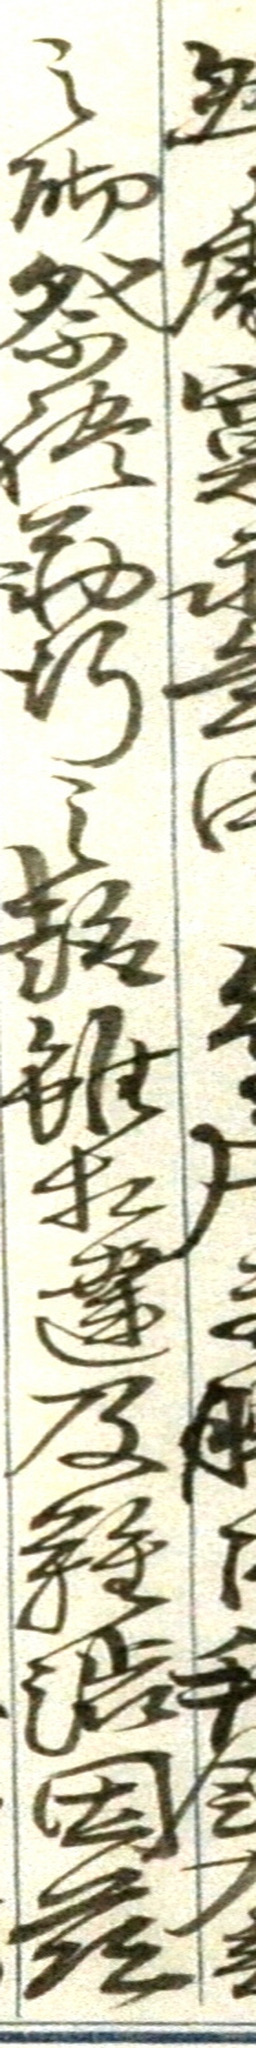之砌祭礼勤行之趣雖相達及難渋因茲
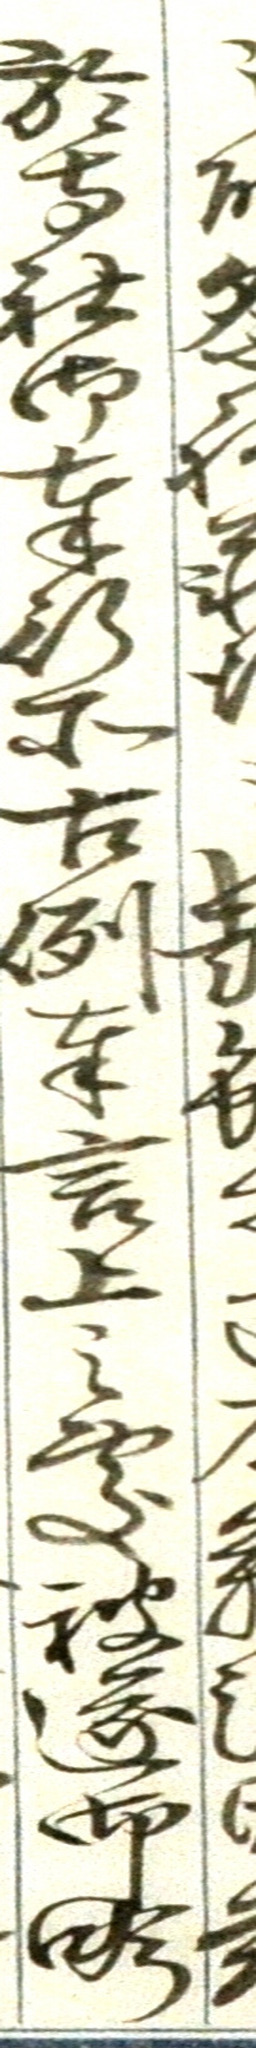於寺社御奉行所古例奉言上之処被遂御吟
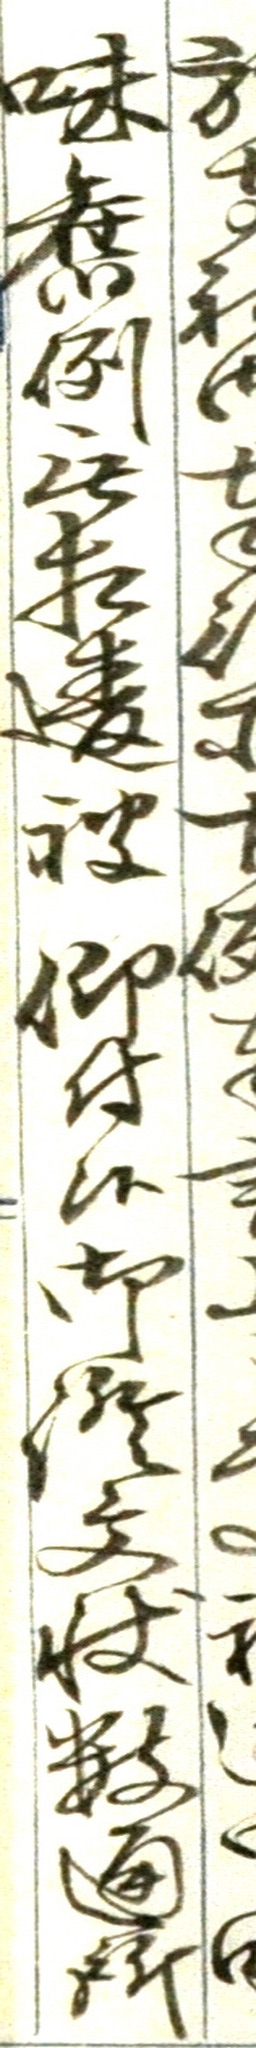味舊例無相違被仰付候御證文状数通所

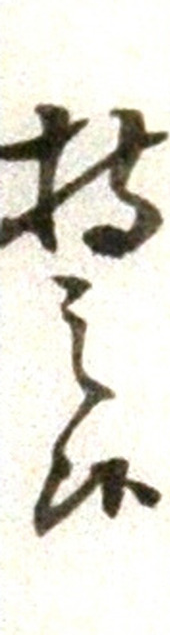持之候
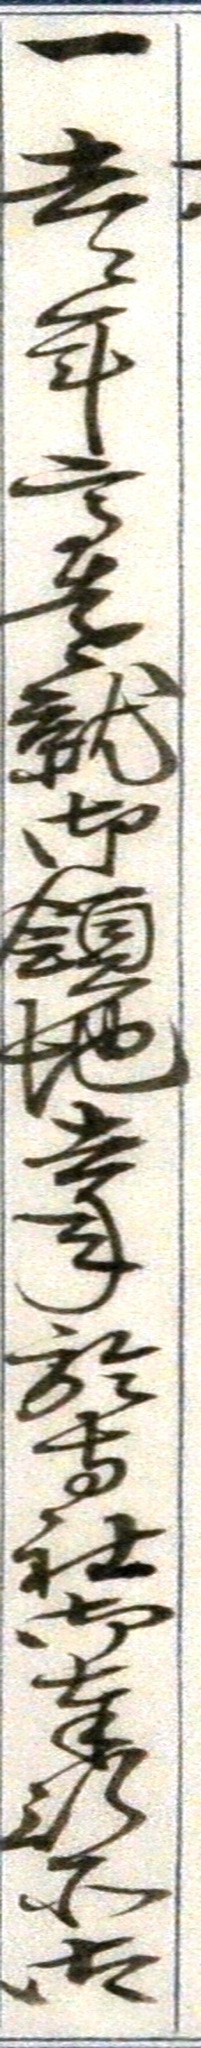一去々年高遠就御領地去年於寺社御奉行所御
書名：諏訪御柱祭之節・騎馬大将御中間頭・御柱引人足
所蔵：伊那市立高遠町図書館・合同会社AMANE
